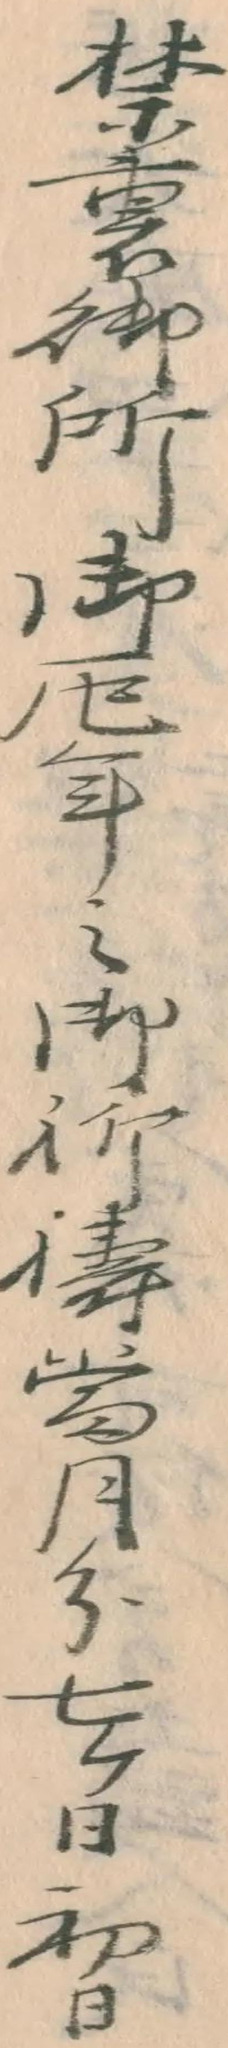禁裏御所御厄年之御祈祷當月分七ケ日初日
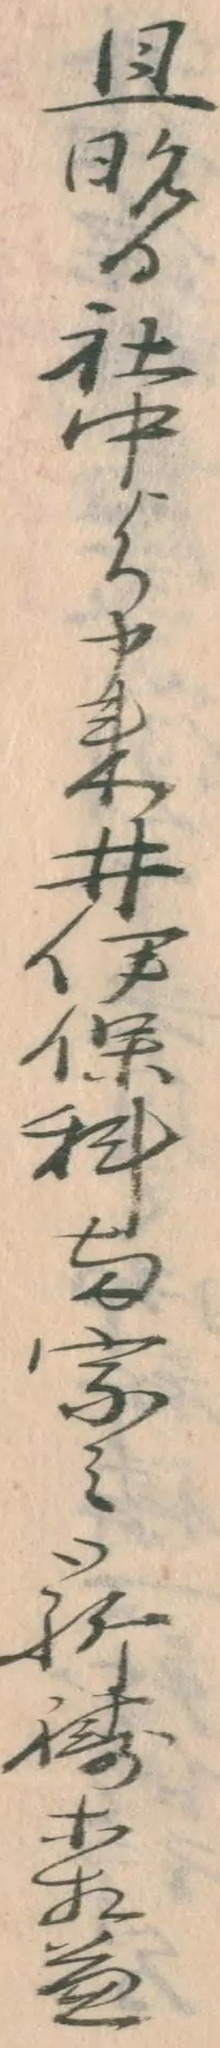且昨日社中より申来井伊保科両家之御祈祷等相兼
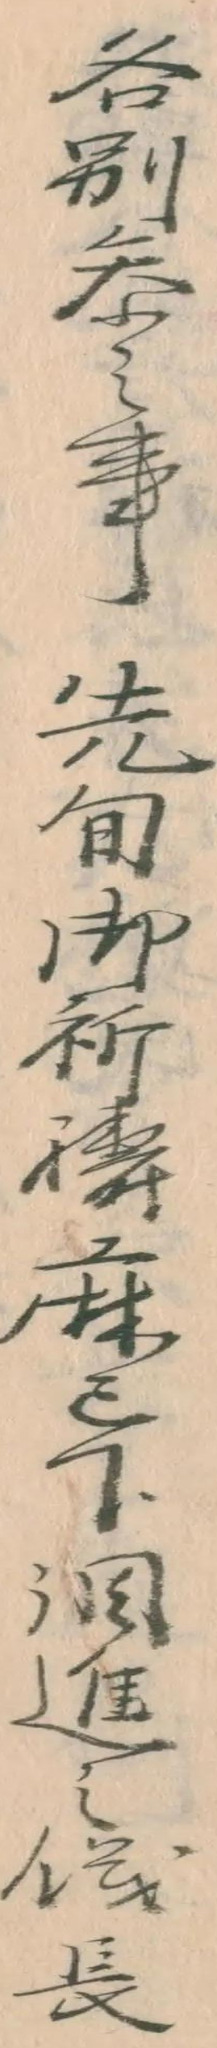各別参之事先旬御祈祷麻已下調進之儀長
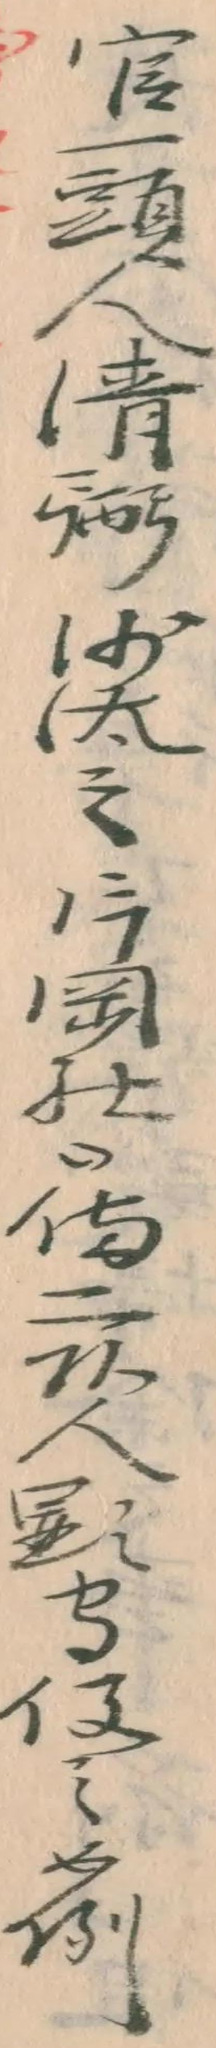官一頭人清弼沙汰之片岡社御備二頭人顕守役之如例
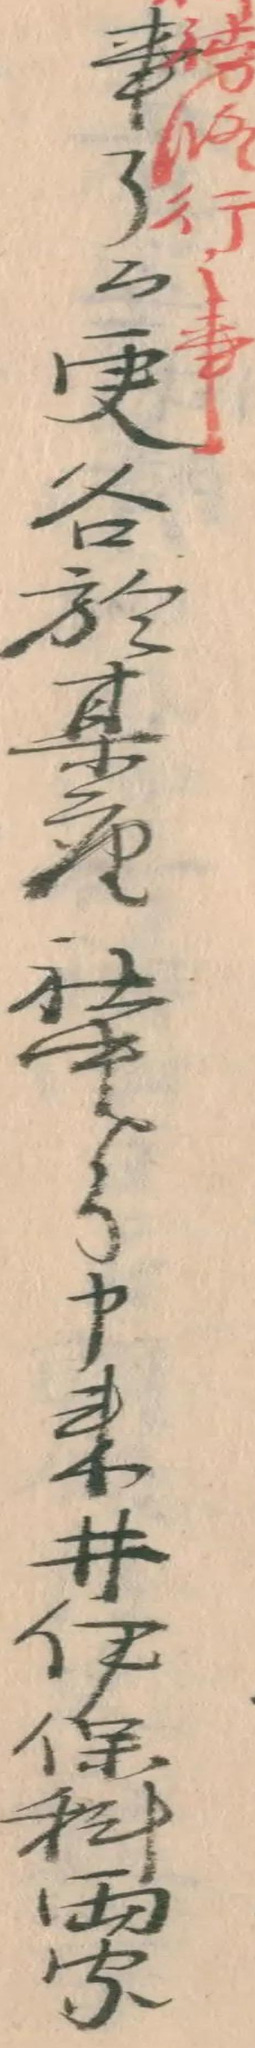事了而更各於某座社中より申来井伊保科両家
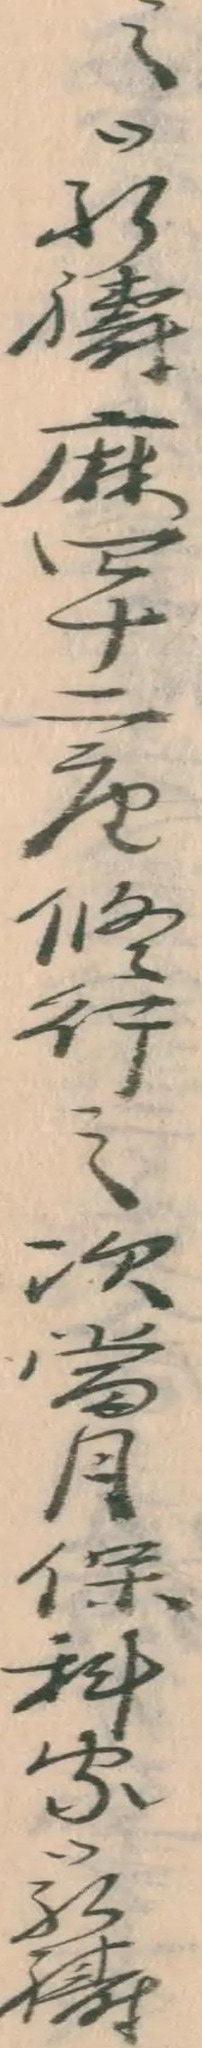之御祈祷麻四十二座修行之次當月保科家御祈祷
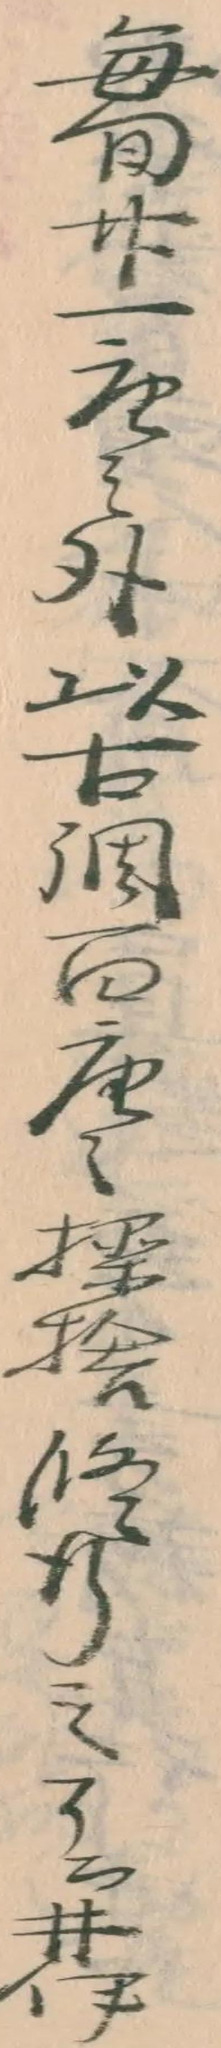毎旬廿一座之外以古調百座之操捨修行之了而井伊
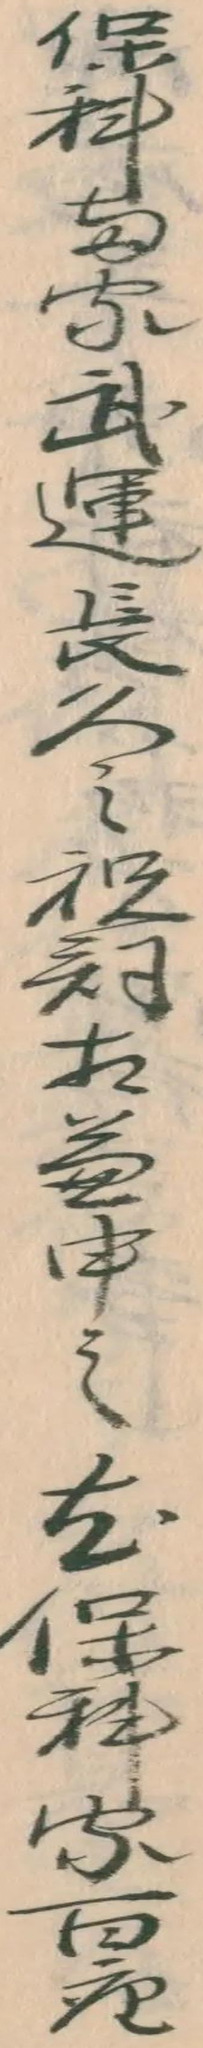保科両家武運長久之祝詞相兼申之尤保科家百座
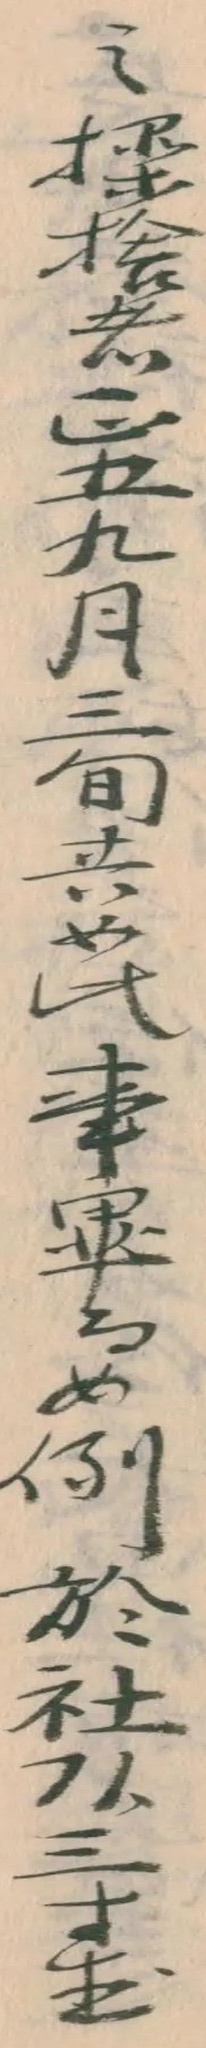之操捨者正五九月三旬共如此事畢而如例於社頭三寸直
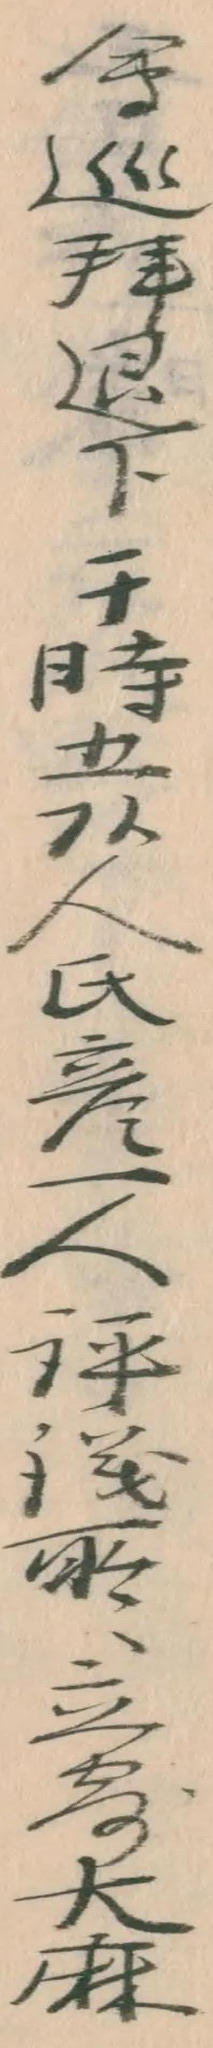會巡拝退下于時五頭人氏彦一人評議所へ立寄大麻
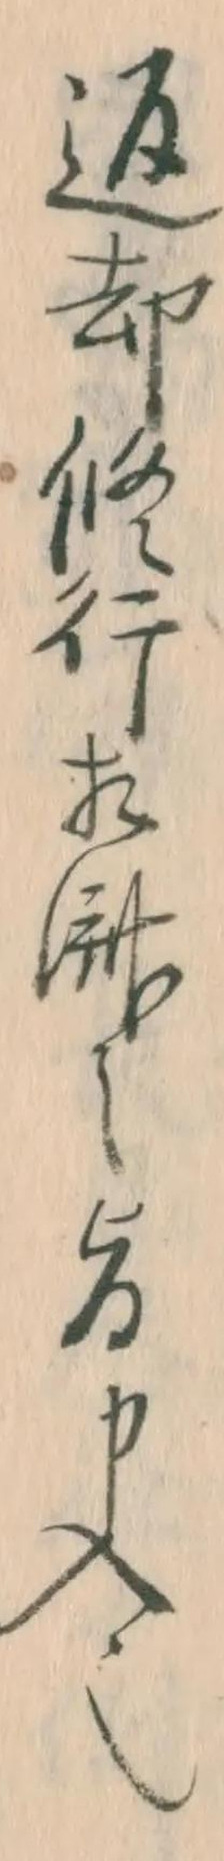返却修行相済之旨申入也
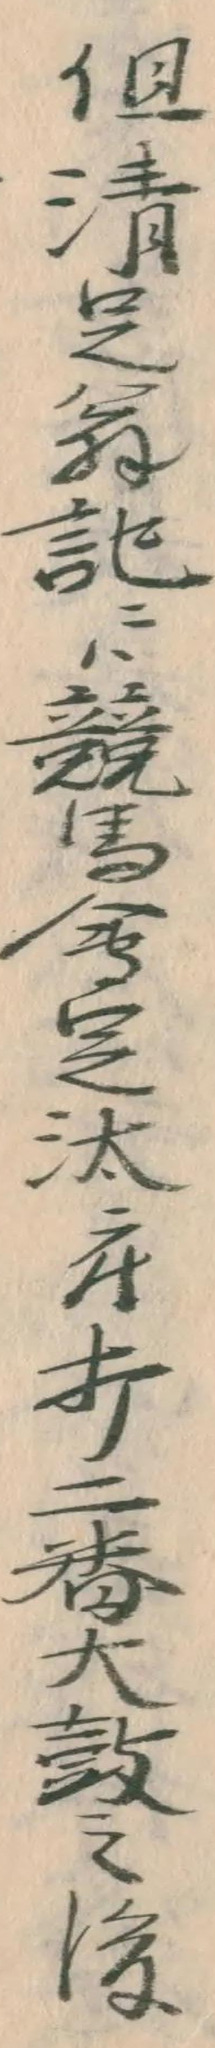但清足翁記ニハ競馬会足汰ニ付打二番大皷之後
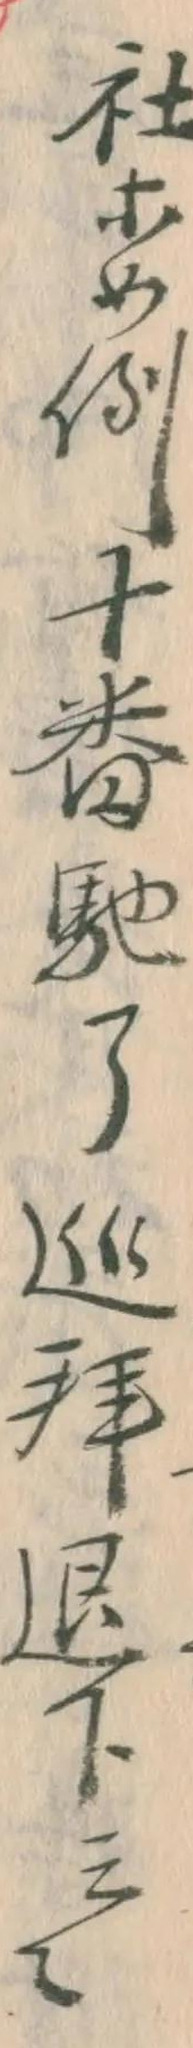社等如例十番馳了巡拝退下云々
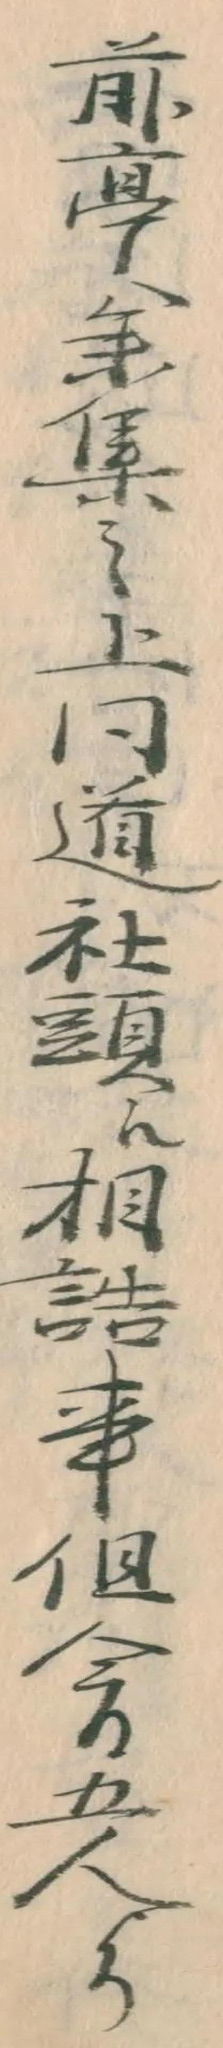前亭へ参集之上同道社頭え相詰事但今日五人より

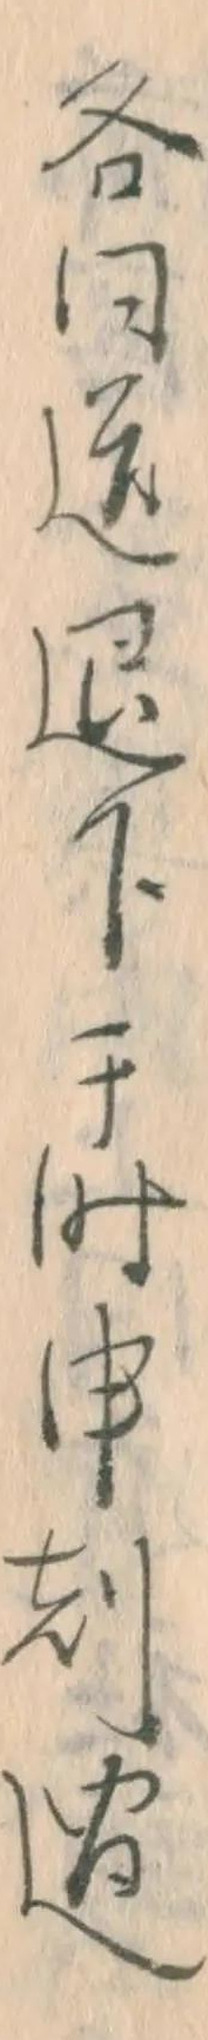各同道退下于時申刻過
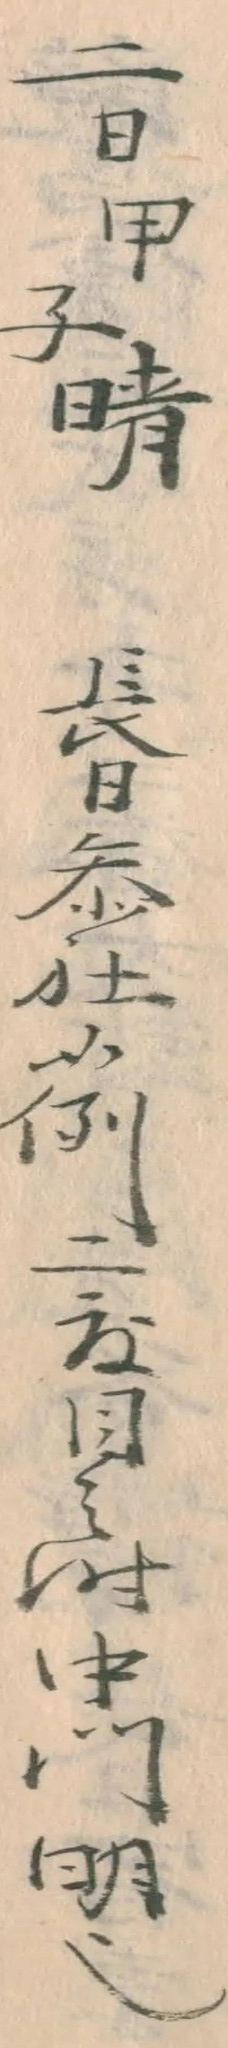二日甲子晴長日参社如例二度目之時中門明也
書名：賀茂社記録. 第73冊
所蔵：国立国会図書館 National Diet Library, JAPAN
